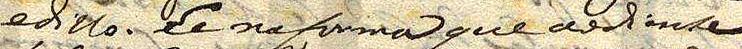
e ditto. he na forma que ao diante
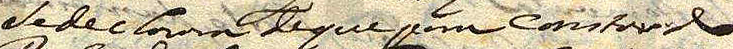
se declara de que para Constar do
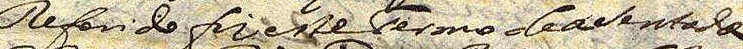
Referido fis este Termo de asentada
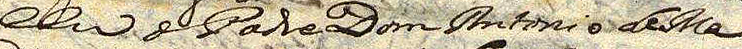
e eu o Padre Dom Antonio de Ma
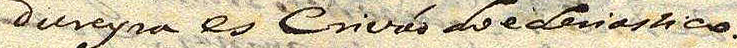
dureyra esCrivão do eclesiastico.
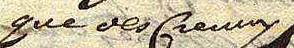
que o esCreuuy
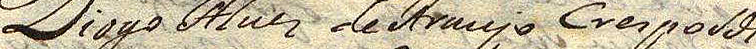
Diogo Alues de Araujo Crespo sol
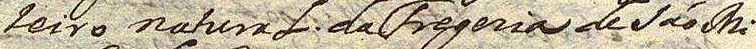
teiro naturaL. da Freguezia de Saõ Mi
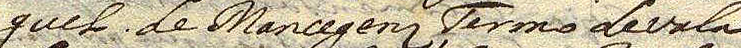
guel de Mancegem, Termo de vala
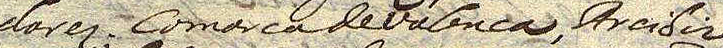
dares; Comarca de valença, Arcebis
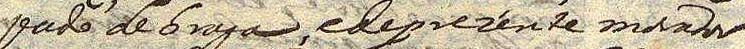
pado de braga, e de prezénte morador
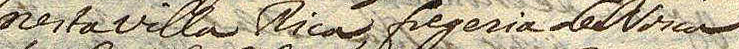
nesta villa Rica, freguezia de Nossa
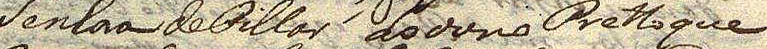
Senhora de Pillar do ouro Pretto que
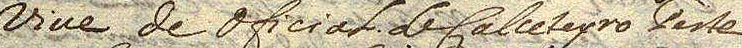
viue de official de Calceteyro Teste
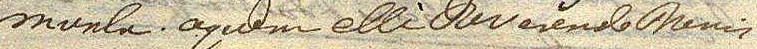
munha. a quel elle Reverendo Menis
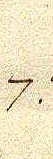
7.a
